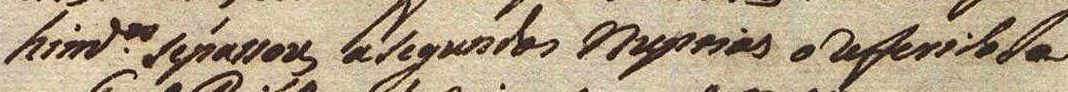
him.tos se passou a segundas nuptias o referido Io
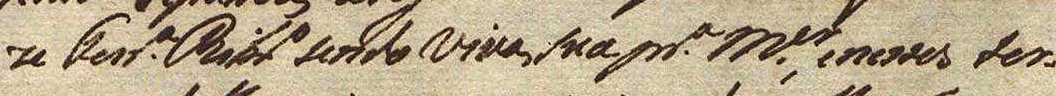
ze Ferr.a Ribr.o sendo viva sua pr.a m.er, e nestes ter
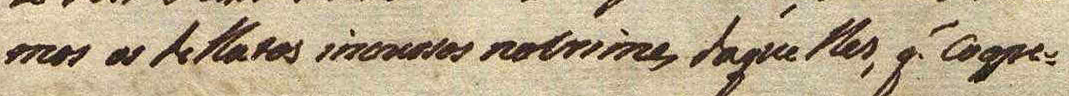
mos os dellatos incursos no crime daquelles, q̄ coope
